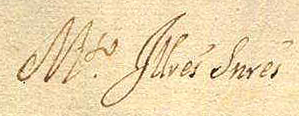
M.to Jllres̄ Snres̄
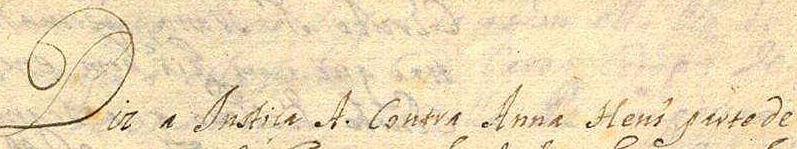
Diz a Iustiça A. Contra Anna Hens̄ parte de
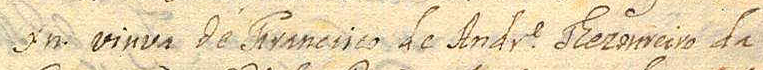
xn. viuva de Francisco de Andr.e Thezoureiro da
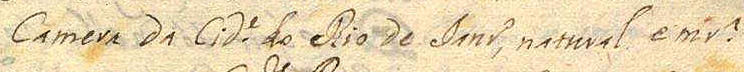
Camera da Cid.e do Rio de Ianro, natural e mr.a
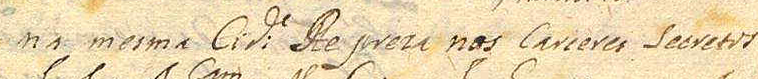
na mesma Cid:e Re preza nos Carceres Secretos
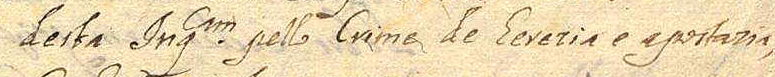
desta Inq.Çam pello Crime de herezia e apostazia,
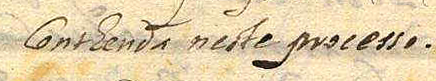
Contheuda neste processo.
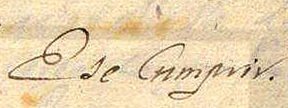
E se Cumprir.
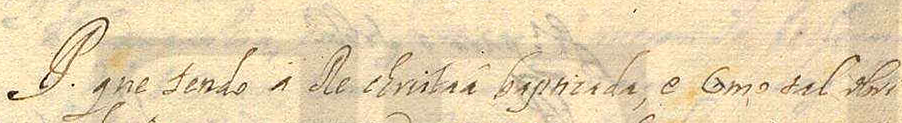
P. que sendo á Re christaã baptizada, e como tal obri
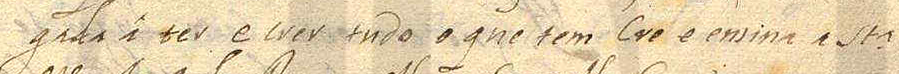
gada á ter e crer tudo o que tem Cre e ensina a st.a
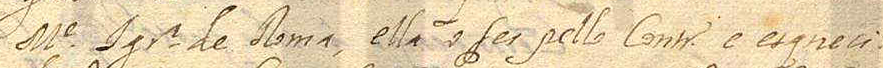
M.e Igr.a de Roma, ella o fes pello Contr.o e esqueci
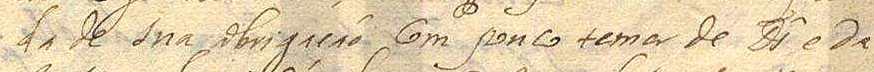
da de sua obrigaçaõ Com pouco temor de Ds̄ e da
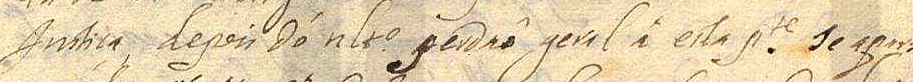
Justiça, depois do ult.o perdaõ geral á esta p.te se apar
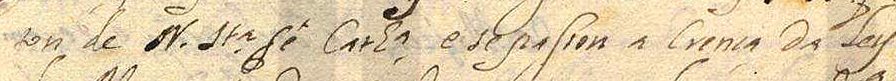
tou de N. st.a fé Cath.a, e se passou à Crença da Ley
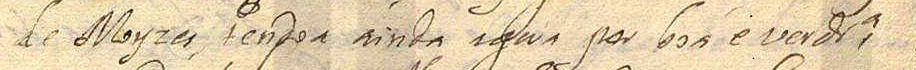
de Moyzes, tendoa ainda agora por boa e verdr.a
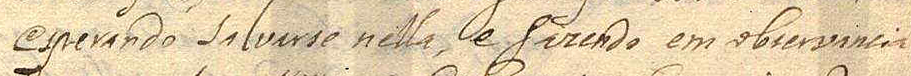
esperando salvarse nella, e fazendo em observancia
